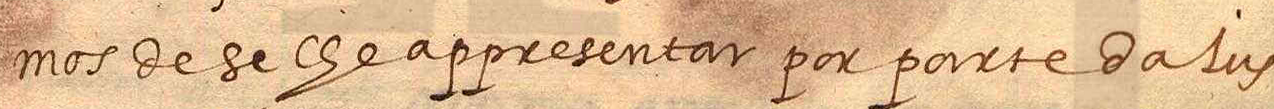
mos de se lhe appresentar por parte da Ius
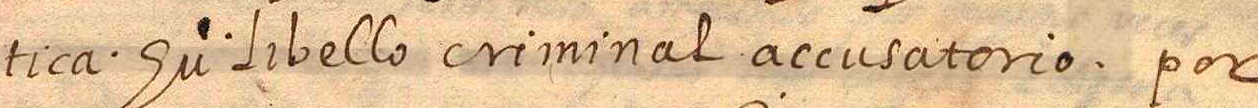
tica hū libello criminal accusatorio . por
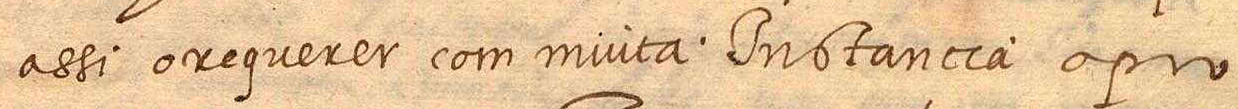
assi o requerer com muita . Instançia o pro
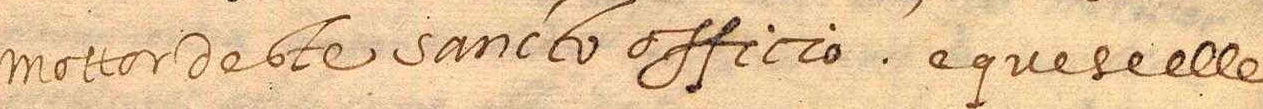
mottor deste sancto officio . e que se elle
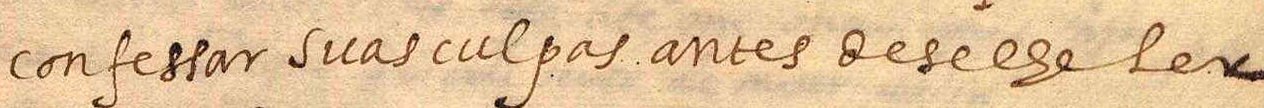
confessar suas culpas antes de se lhe Ler
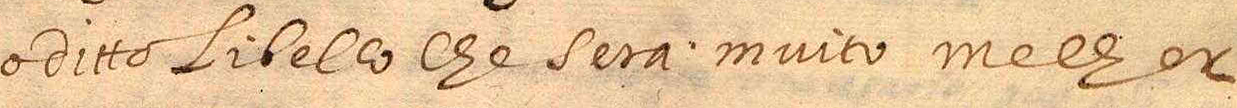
o ditto Libello lhe sera muito melhor
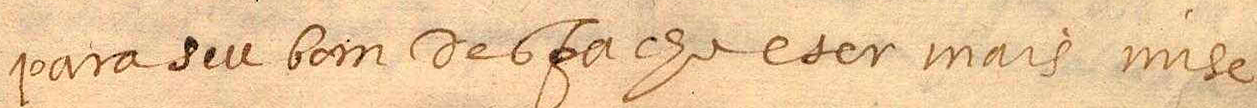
para seu bom despacho e ter mais mise
